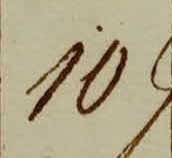10
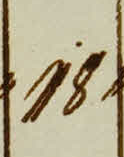18
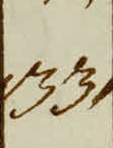33
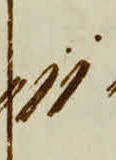11
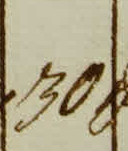30
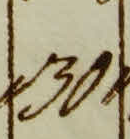30
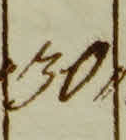30
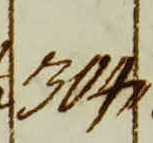304
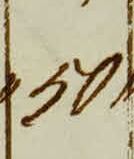50
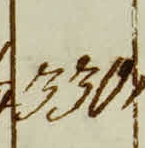330
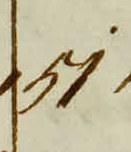51
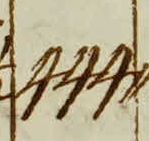444
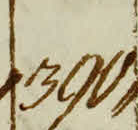390
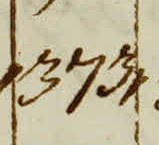373
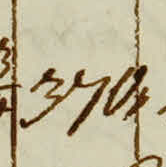370
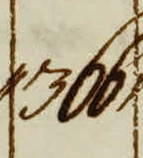366
